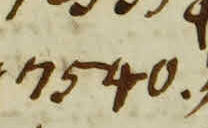7540
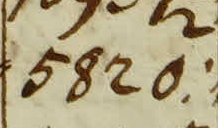5820.
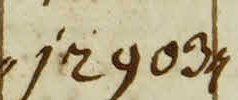12903
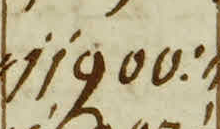11900.
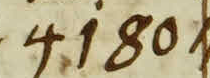4180
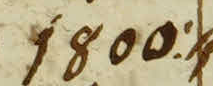1800:
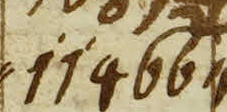11466
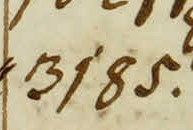3185
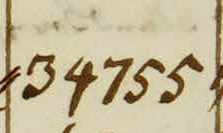34755
